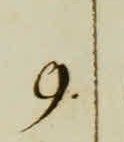9.
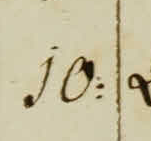10:
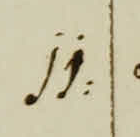11:
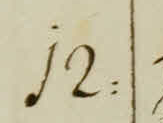12:
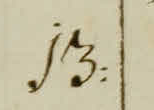13:
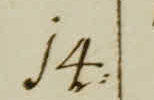14:
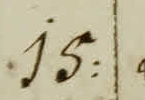15:
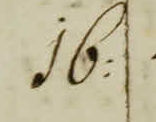16:
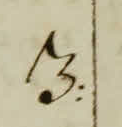3:
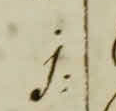1:
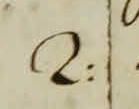2:
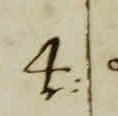4:
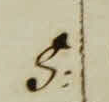5:
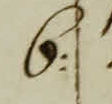6:
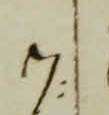7:
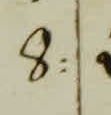8:
